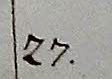27.
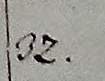32.
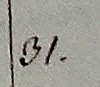31.
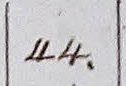44.
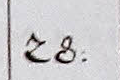28.
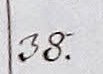38.
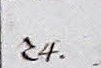24.
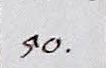50.
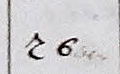26
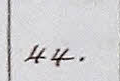44.
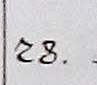28.
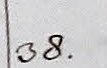38.
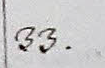33.
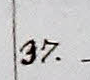37.
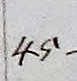45
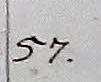57.
